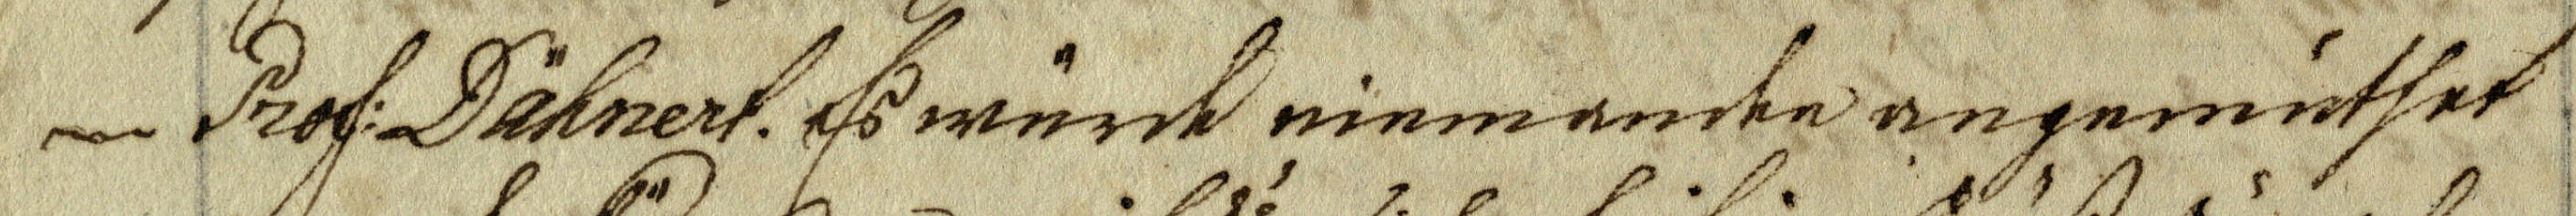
Prof. Dähnert. Es würde niemanden angemuthet
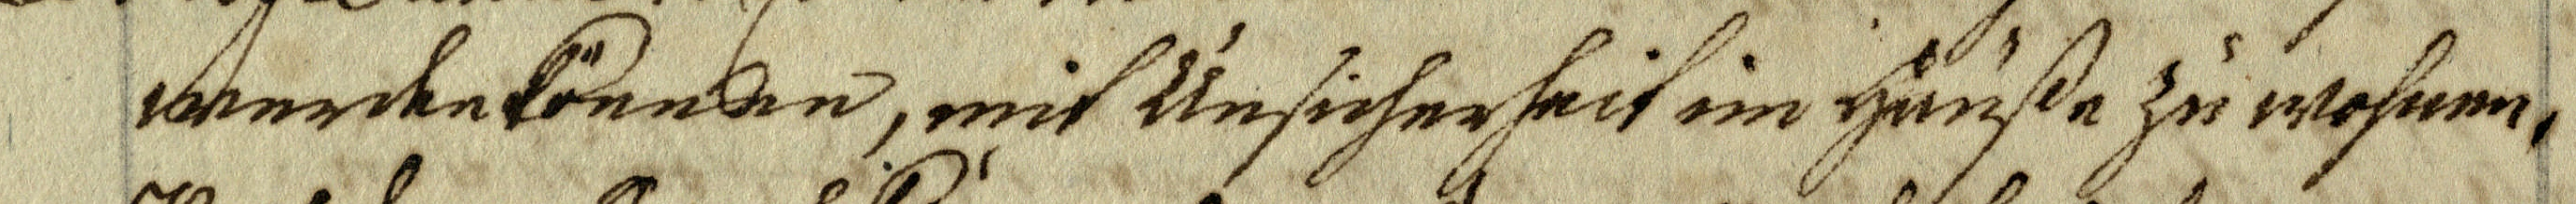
werden können, mit Unsicherheit im Hauße zu wohnen,
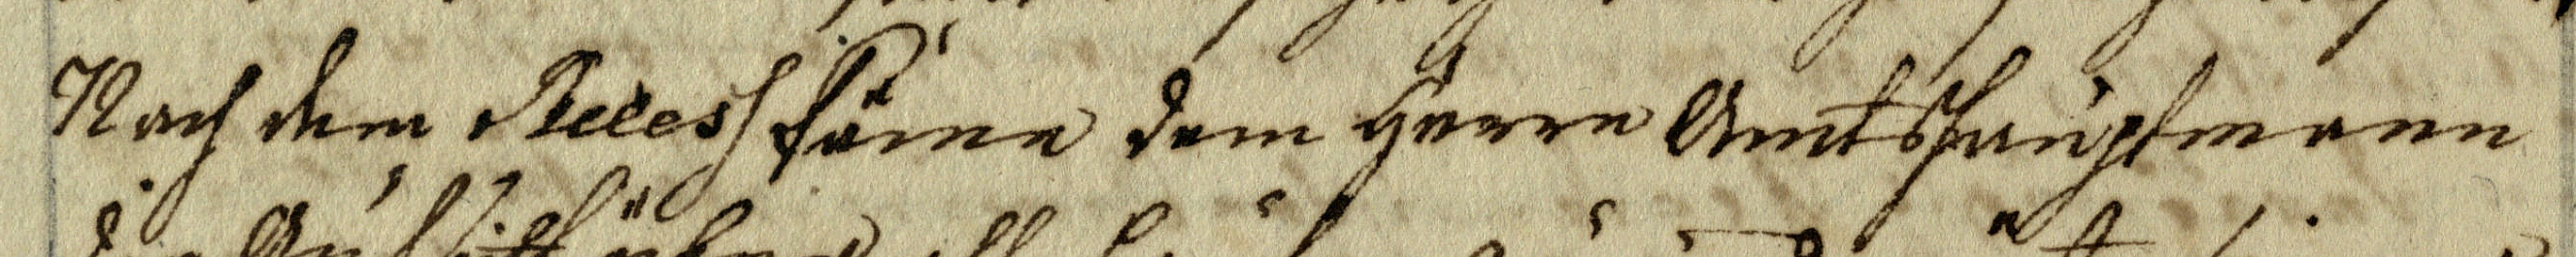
Nach dem Recess käme dem Herrn Amtshauptmann
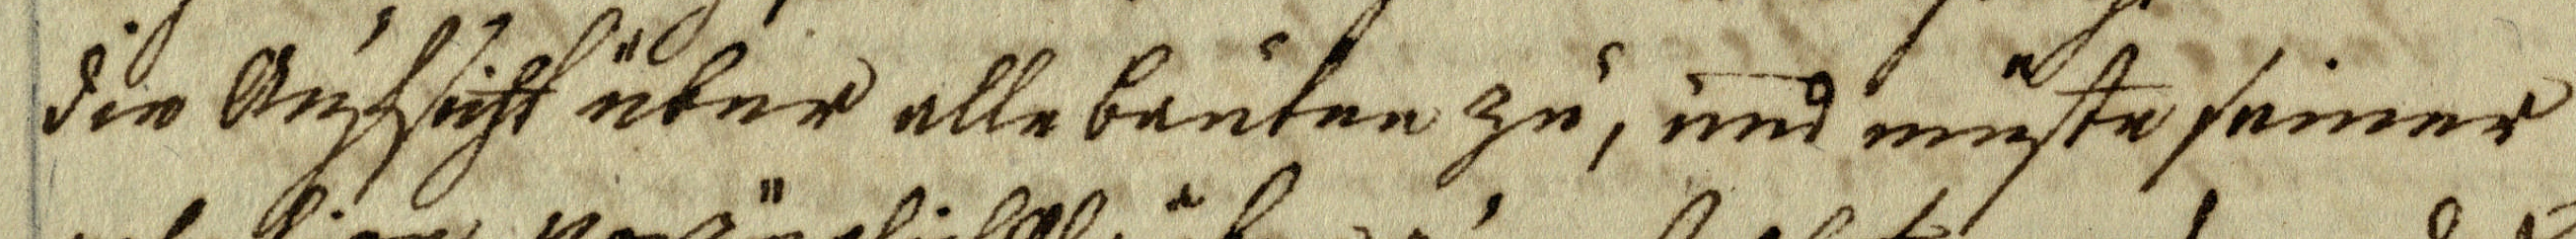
die Aufsicht über alle Bauten zu, und müßte seiner
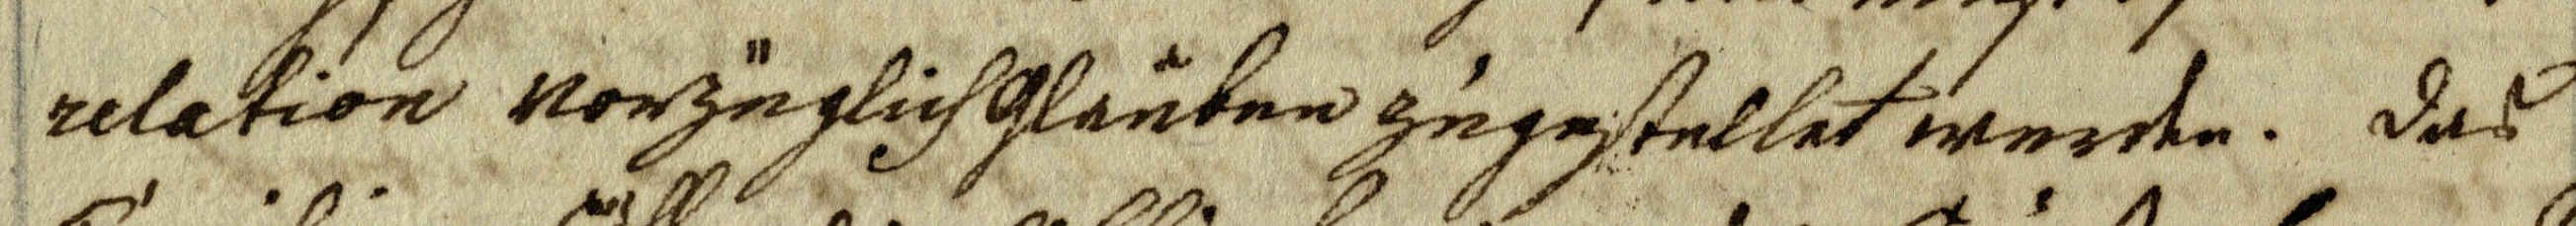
relation vorzüglich Glauben zugestellet werden. Das
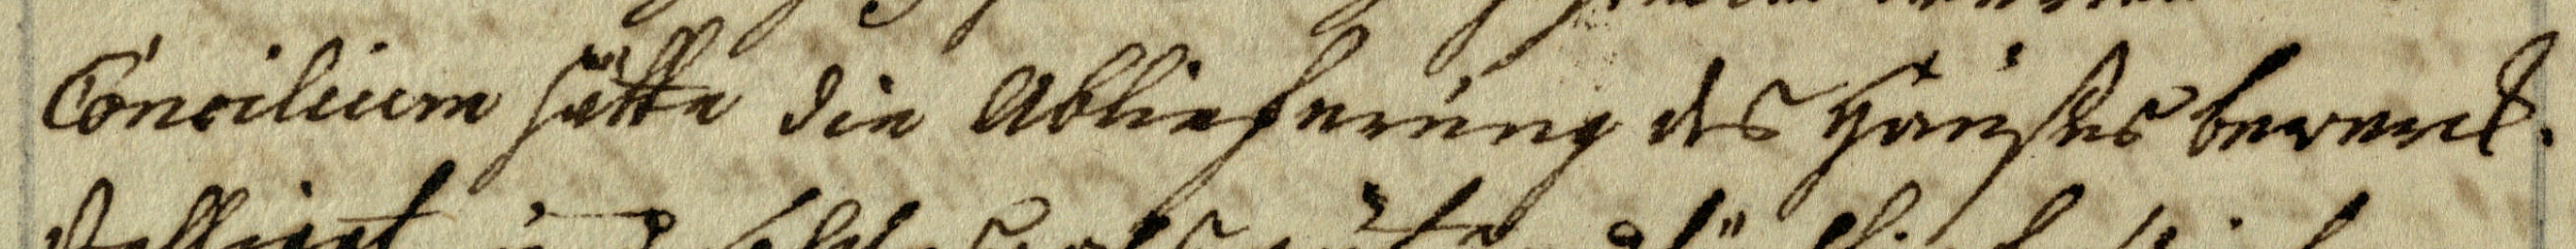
Concilium hätte die Ablieferung des Haußes bewerk¬
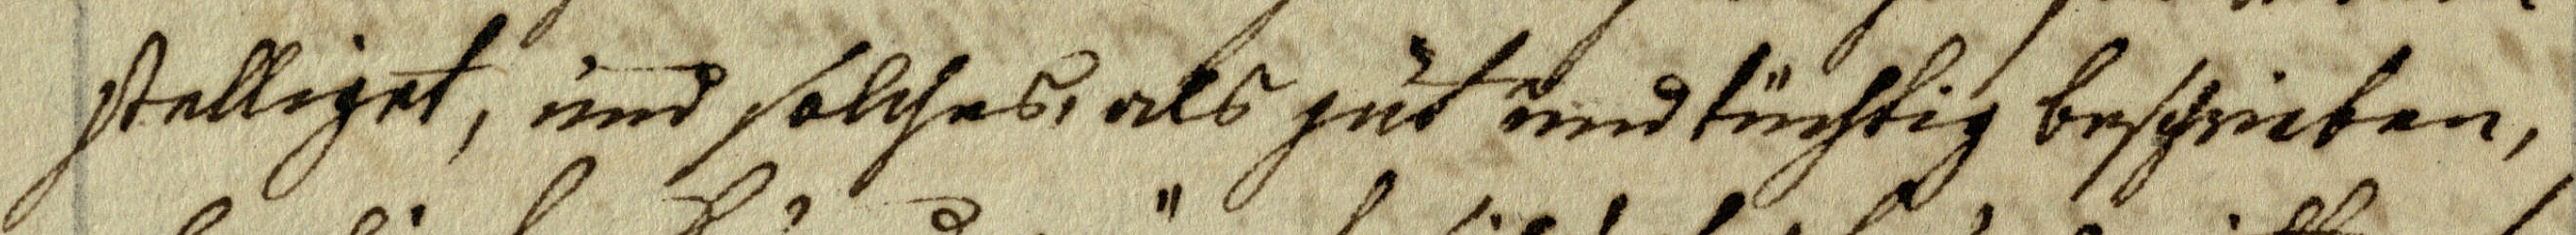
stelliget, und solches als gut und tüchtig beschrieben,
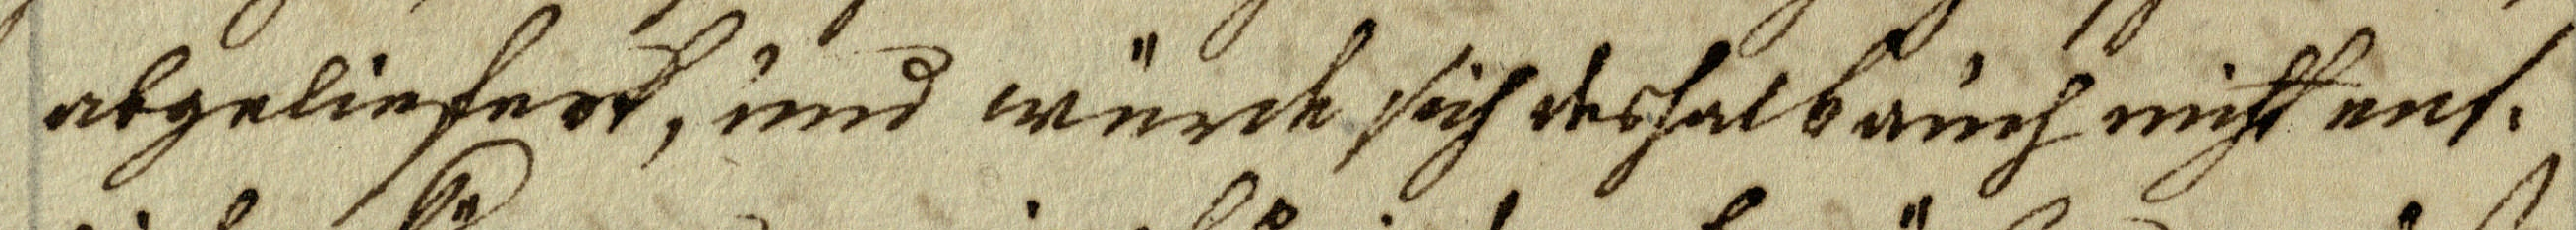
abgeliefert, und würde sich deshalb auch nicht ent¬
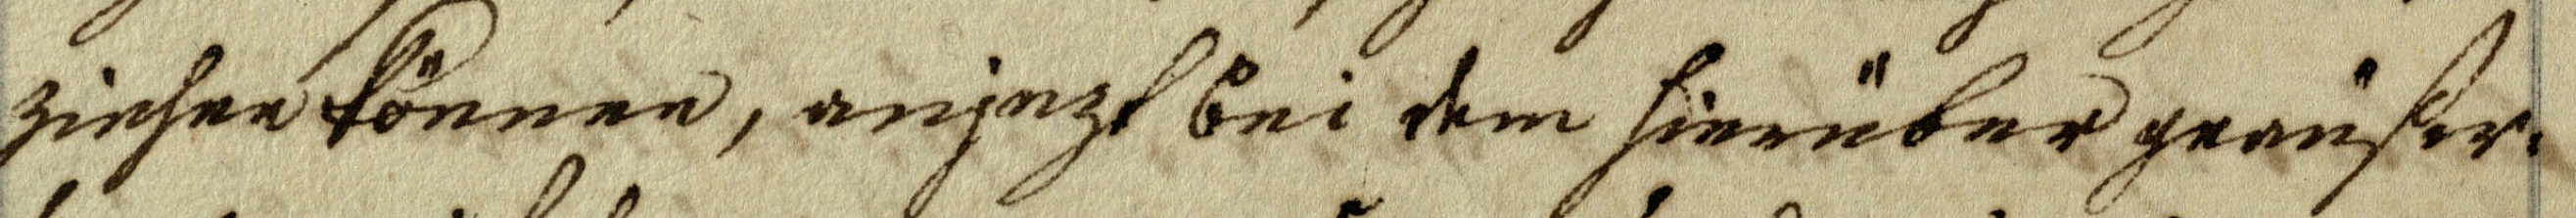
ziehen können, anjezt bei dem hierüber geäußer¬
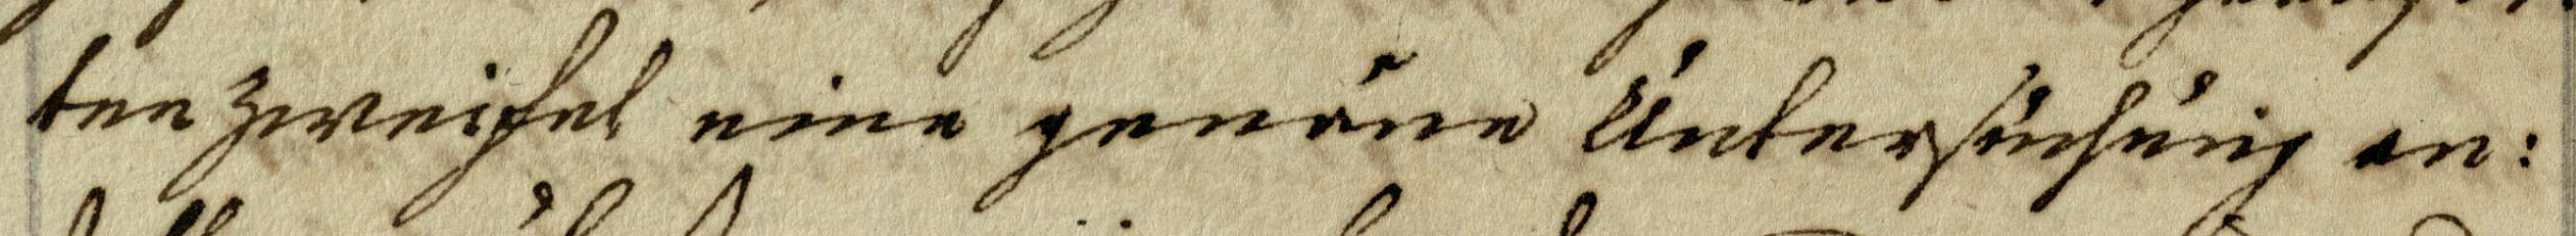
ten Zweifel eine genaue Untersuchung an¬
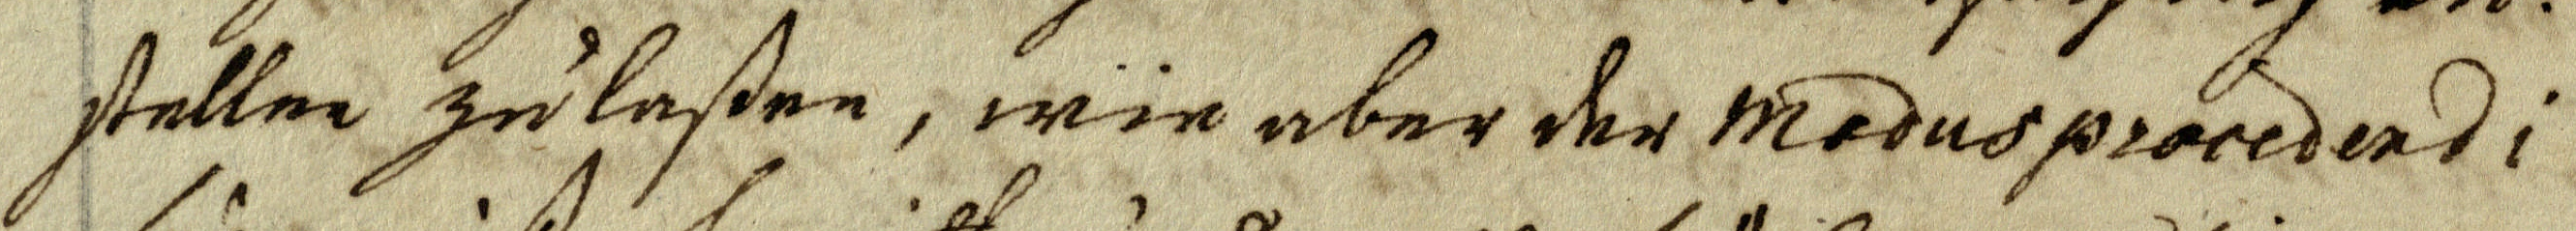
stellen zu laßen, wie aber der Modus procedendi
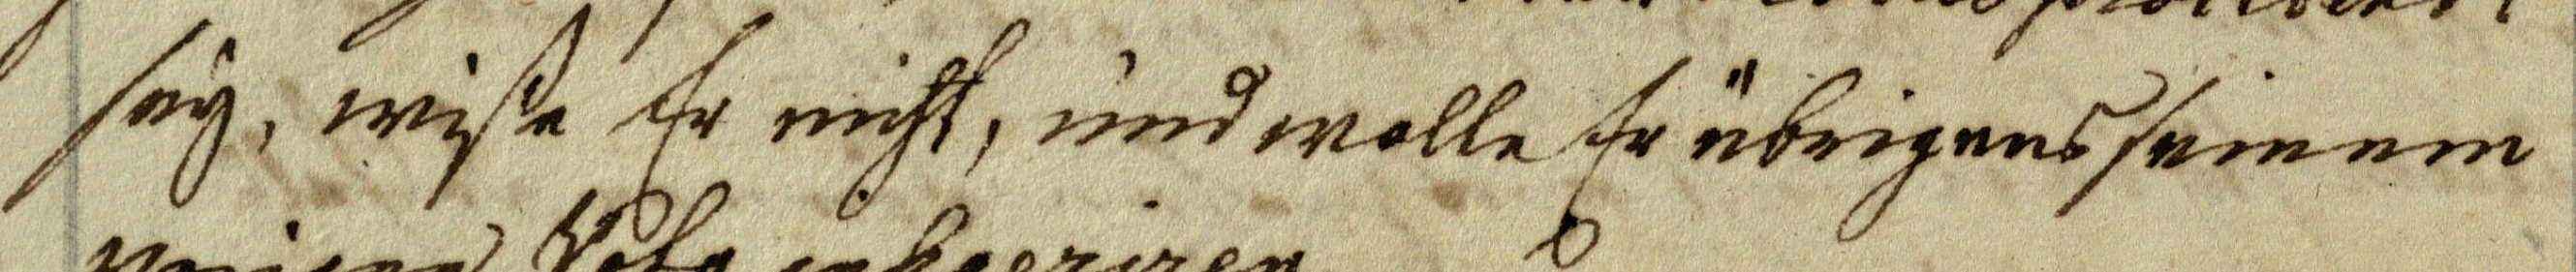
seÿ, wiße Er nicht, und wolle Er übrigens seinem
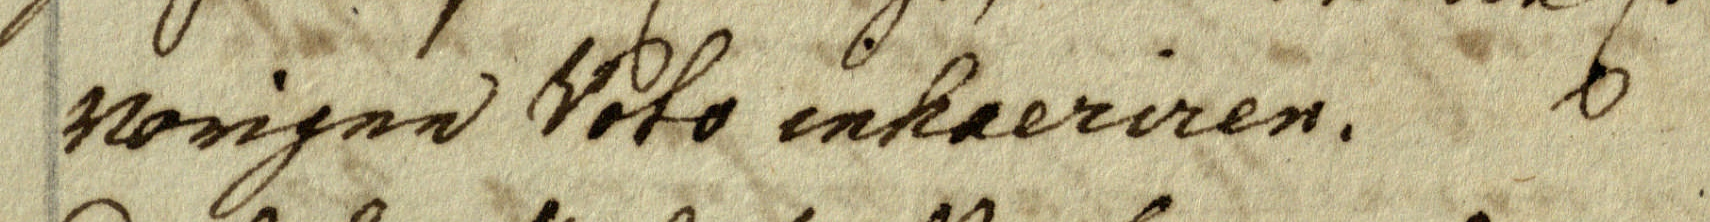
vorigen Voto inhaeriren.
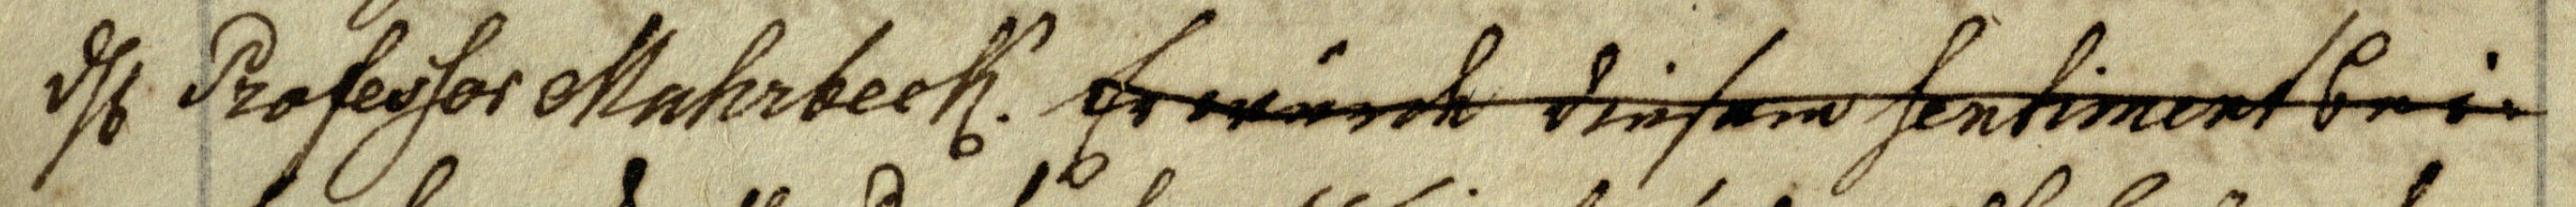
dh. Professor Muhrbeck.
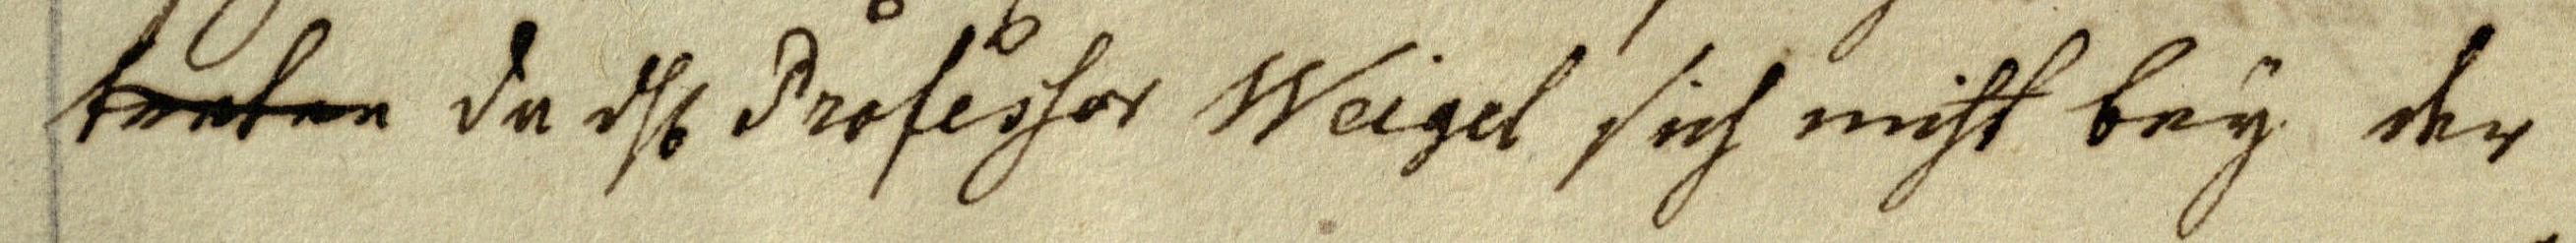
da dh Professor Weigel sich nicht beÿ der
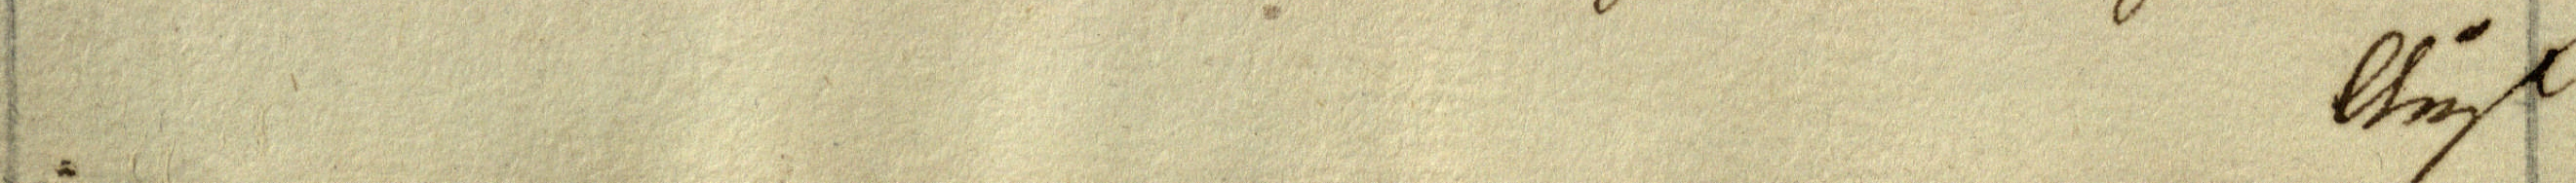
Auß
